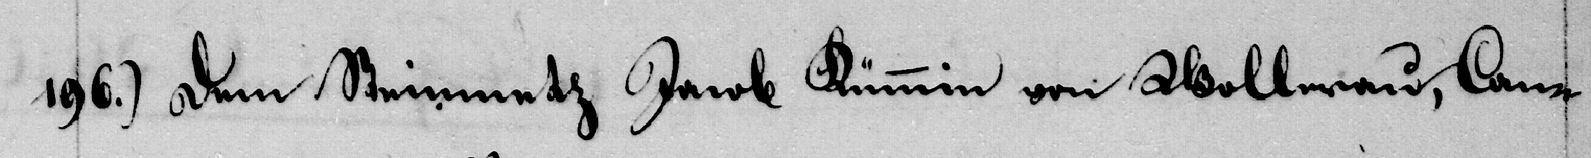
196.) Dem Steinmetz Jacob Kümmin von Wollerau, Can¬
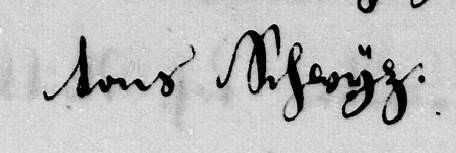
tons Schwyz.
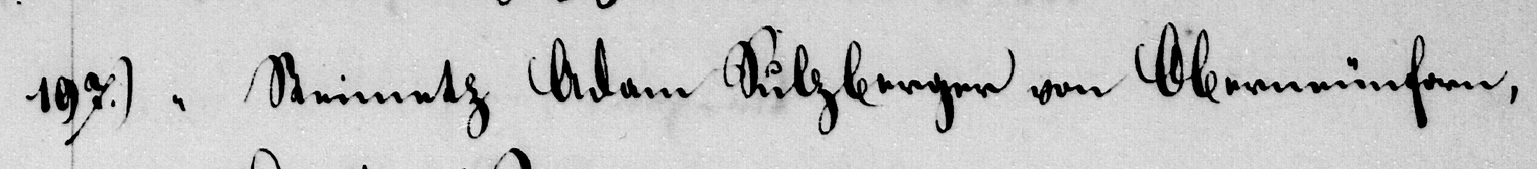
197.) “ Steinmetz Adam Sulzberger von Oberneunforn,
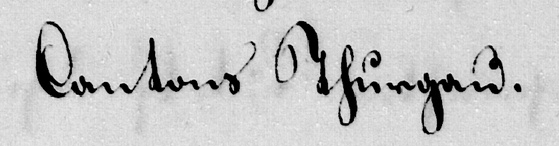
Cantons Thurgau.
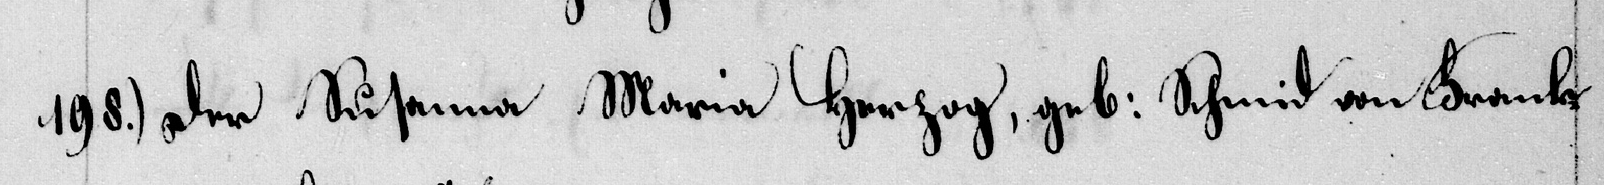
198.) Der Susanna Maria Herzog, geb: Schmid von Frank¬
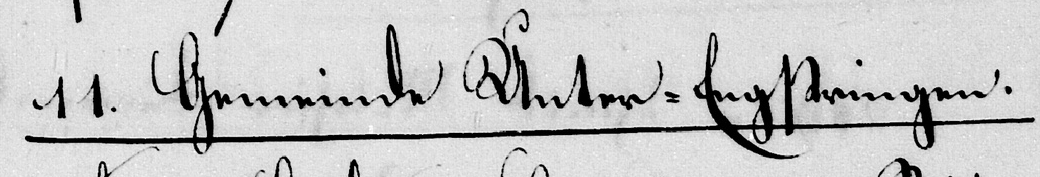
11. Gemeinde Unter-Engstringen.
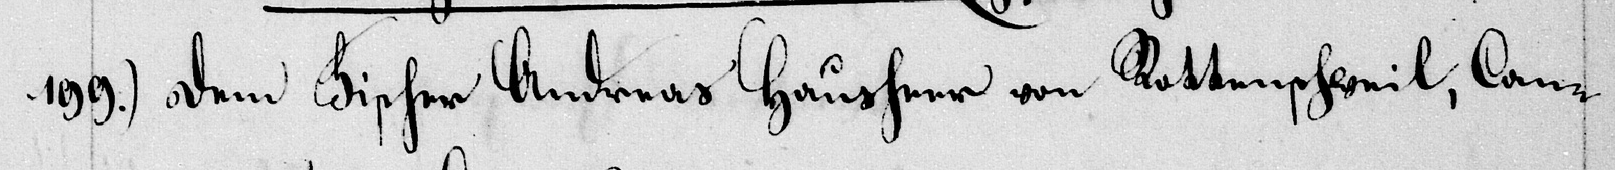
199.) Dem Fischer Andreas Hausheer von Rottenschweil, Can¬
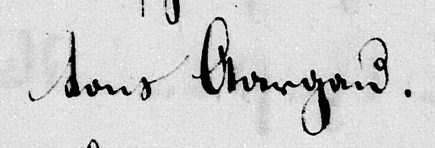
tons Aargau.
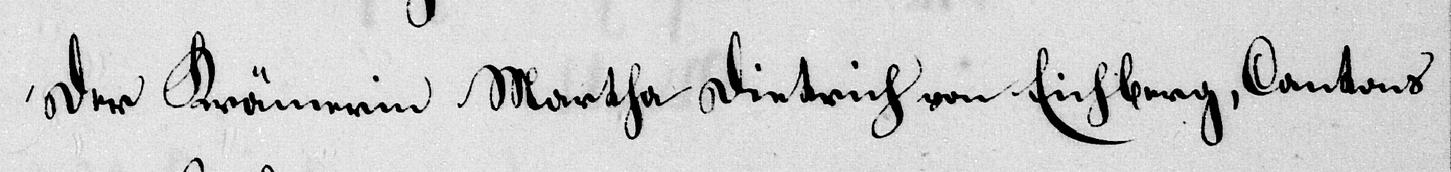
Der Krämerin Martha Dietrich von Eichberg, Cantons
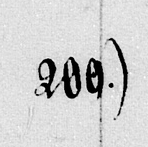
204.)
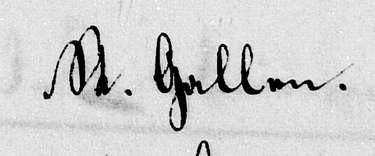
St. Gallen.
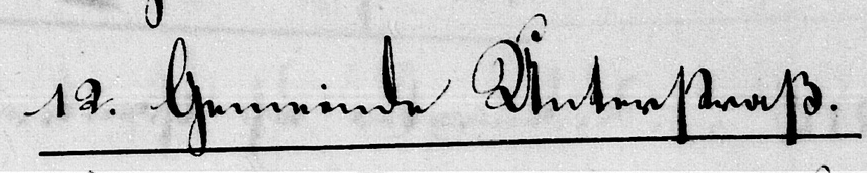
12. Gemeinde Unterstraß.
